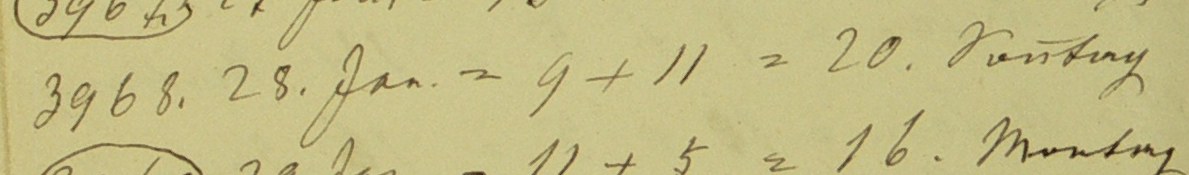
3968 28. Jan. = 9 + 11 = 20 Sonntag
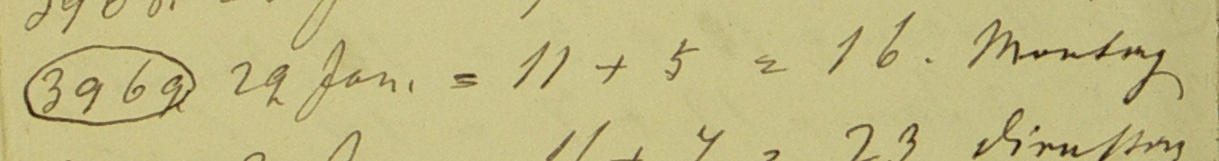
3969 29. Jan = 11 + 5 = 16 Montag
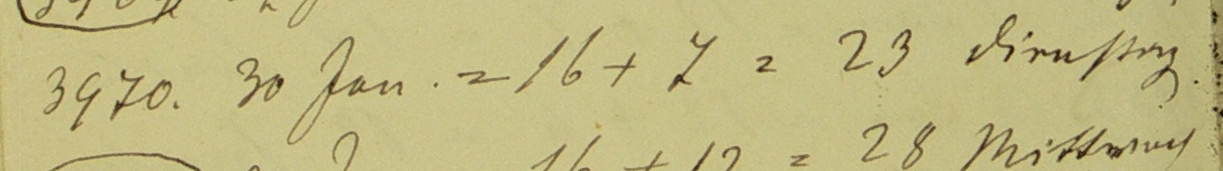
3970 30. Jan. = 16 + 7 = 23 Dienstag
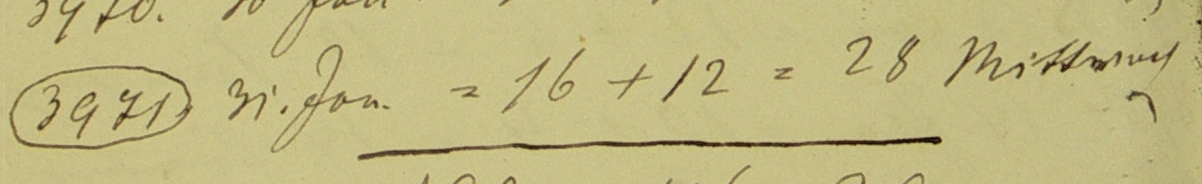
3971 31. Jan. = 16 + 12 = 28 Mittwoch
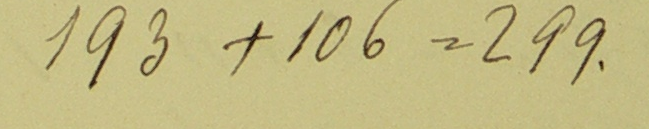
193 + 106 = 299
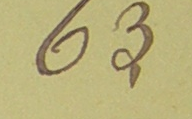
63
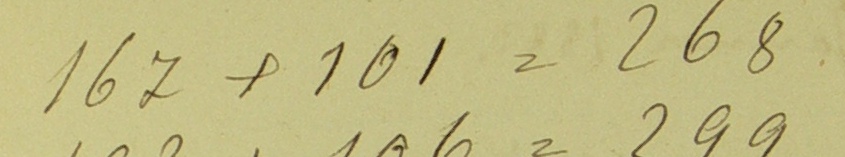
167 + 101 = 268
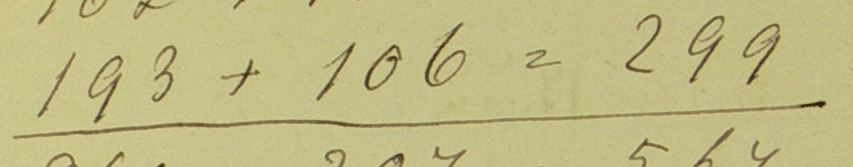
193 + 106 = 299
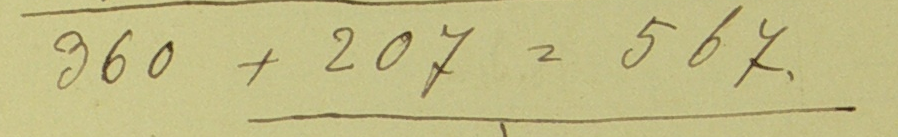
360 + 207 = 567
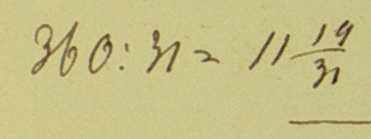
360:31= 11 19/31
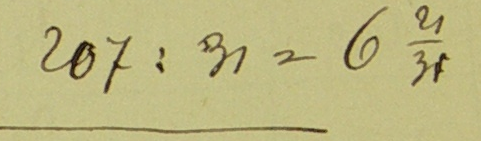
207:31= 6 21/31
